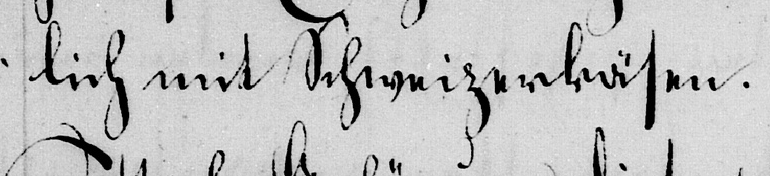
lich mit Schweizerkäsen.
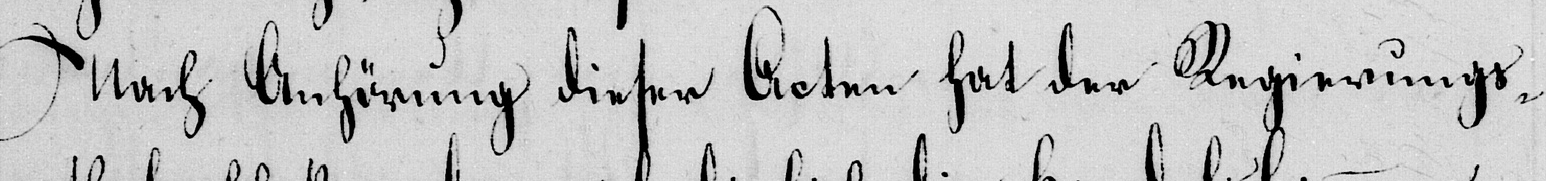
Nach Anhörung dieser Acten hat der Regierungs¬
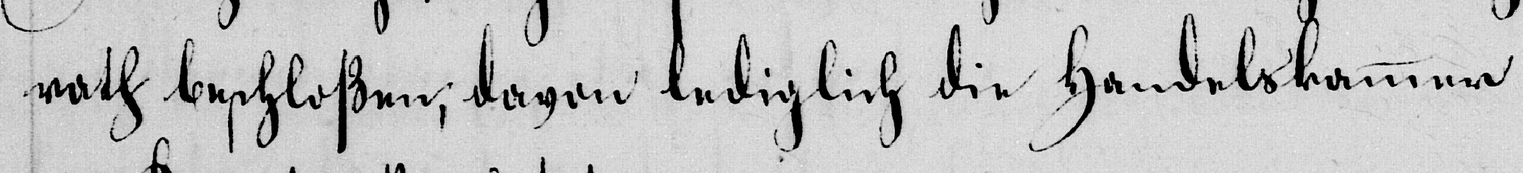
rath beschloßen, davon lediglich die Handelskammer
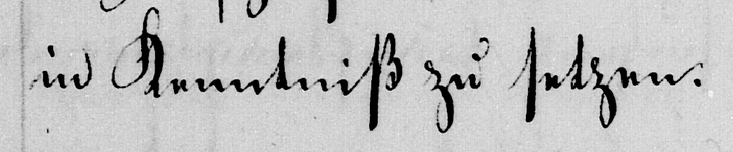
in Kenntniß zu setzen.
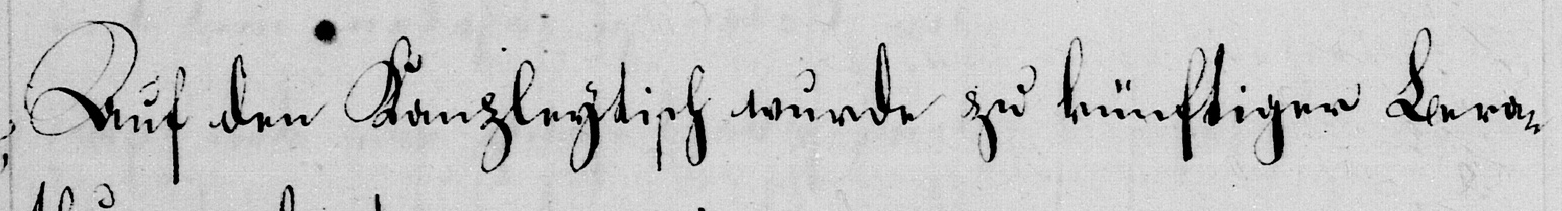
Auf den Kanzleytisch wurde zu künftiger Bera¬
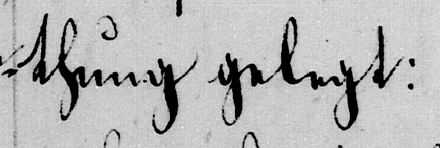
thung gelegt:
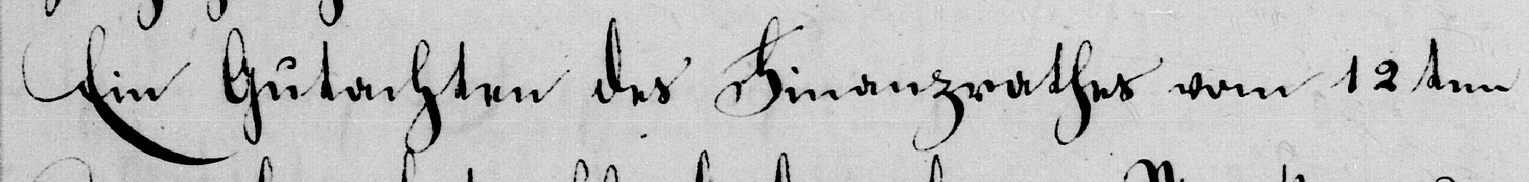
Ein Gutachten des Finanzrathes vom 12ten
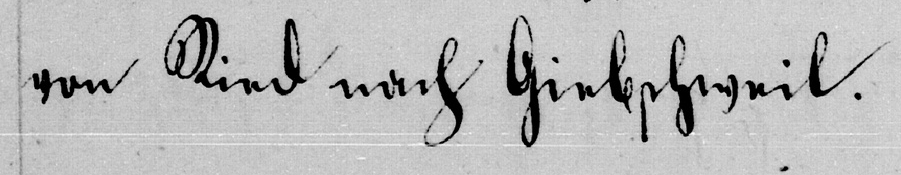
von Ried nach Giebschweil.
